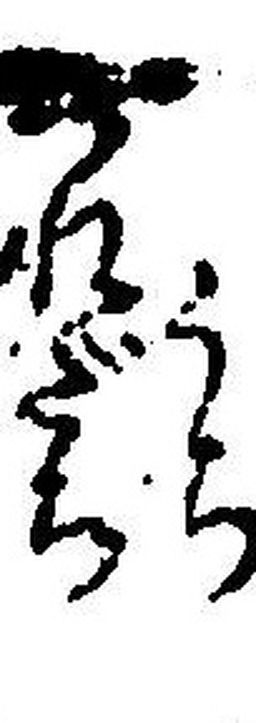つれだち
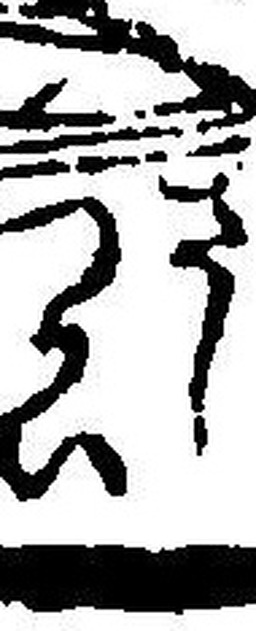つかい
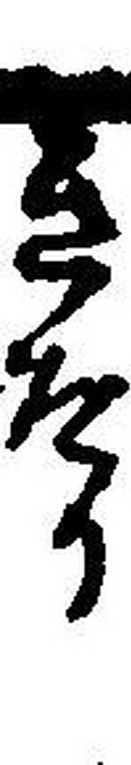きたり
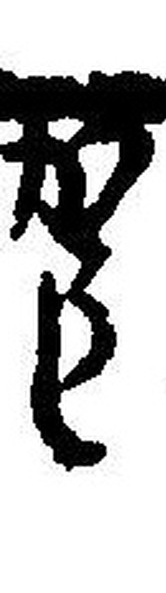かうし
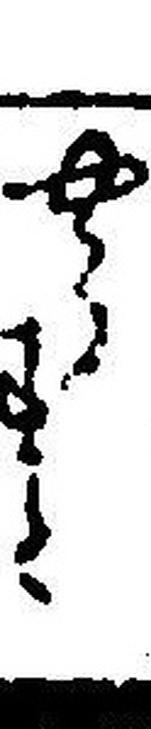やうすと
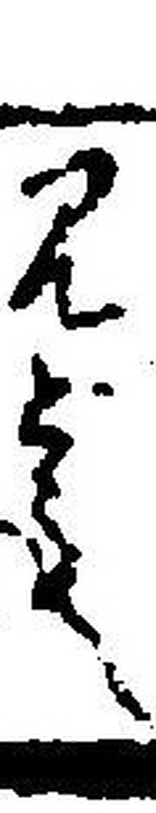見どう
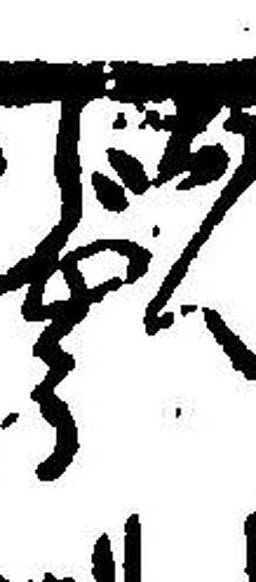じやう
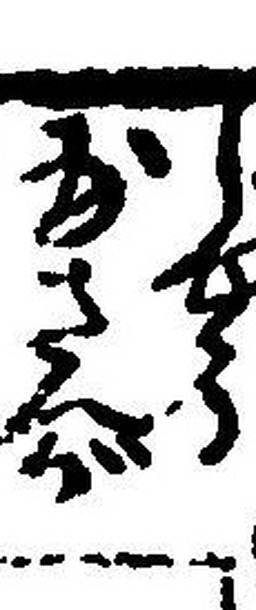玉さんが
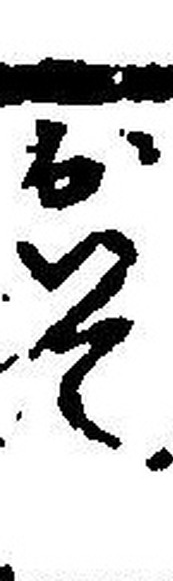おいて
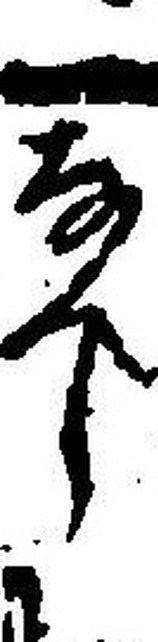なんし
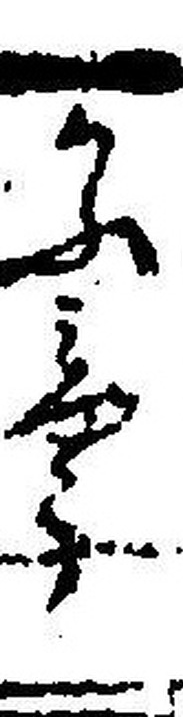かふみやう
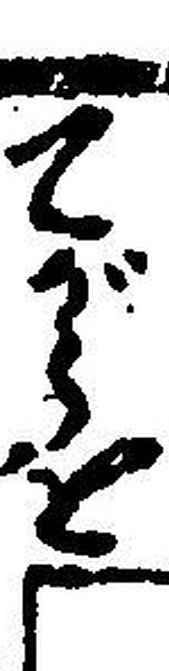てがらを
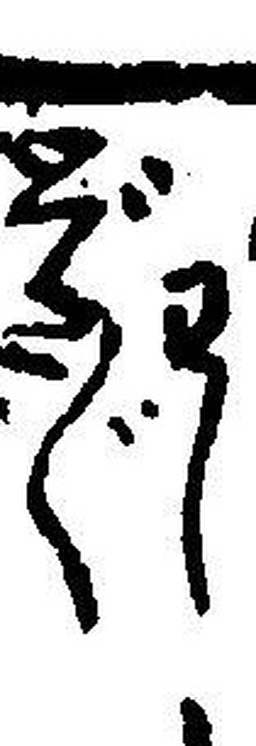どた〴〵
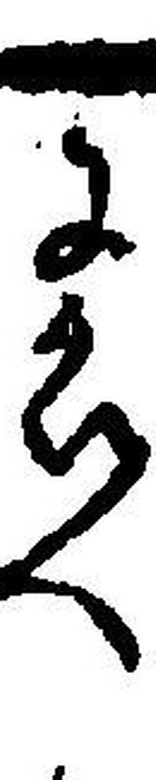にかいへ
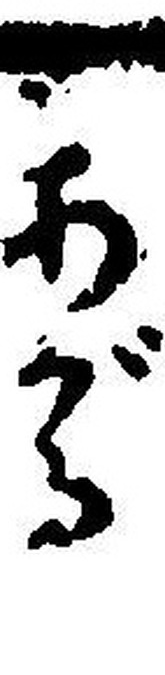あがる

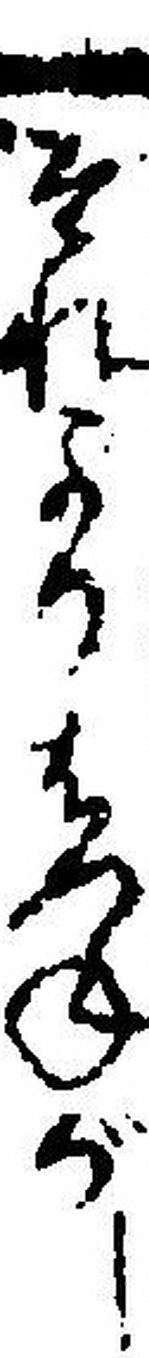それよりはつねが
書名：間違狐之女郎買 / 市場通笑作
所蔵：東京大学総合図書館 General Library in the University of Tokyo, JAPAN
